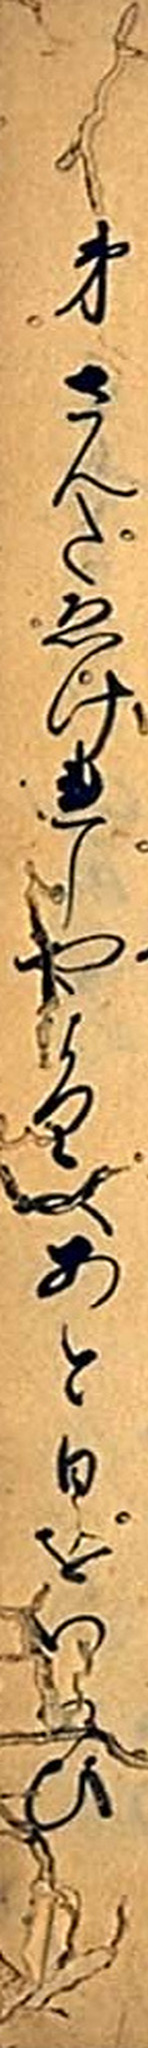弟さんたゑけれしやよりへあと日をいひ

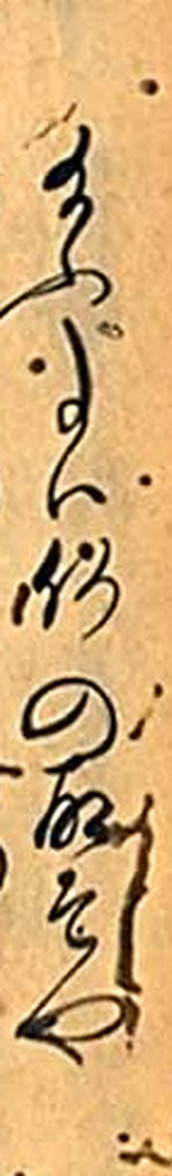給ふ事は何の故そや
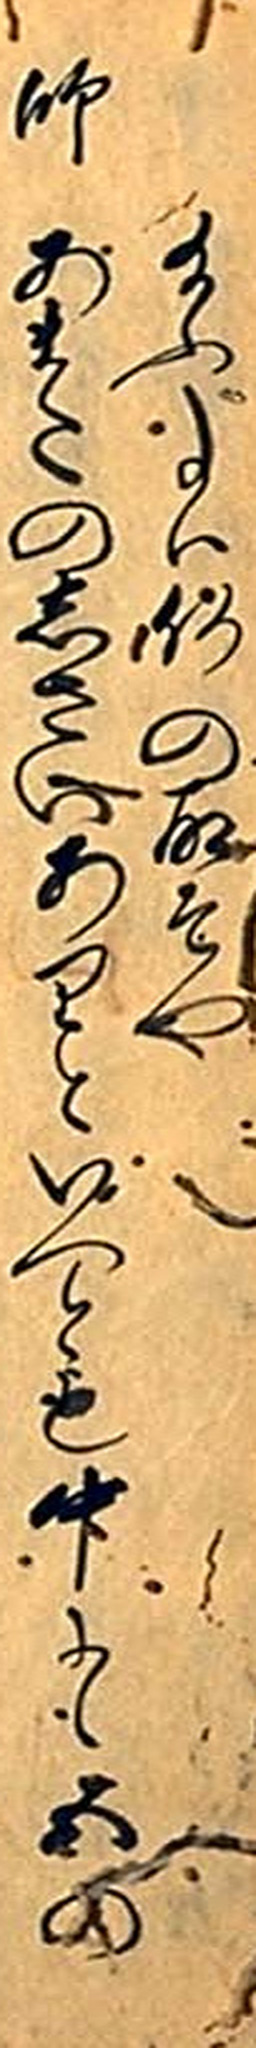師あまたのしさいありといへとも中にも五の
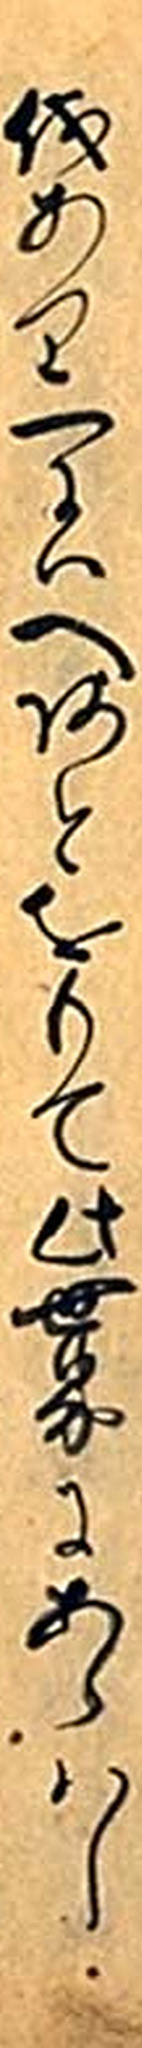儀あり一にはへあとをもて此世界にあらはし
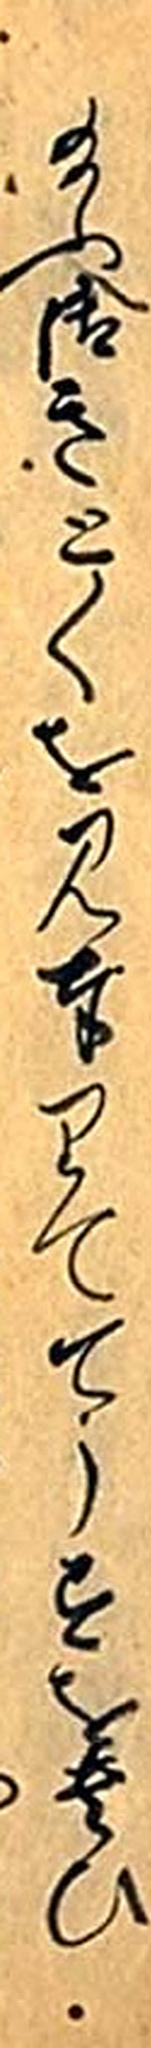給ふ御きとくを見奉りててうすを貴ひ
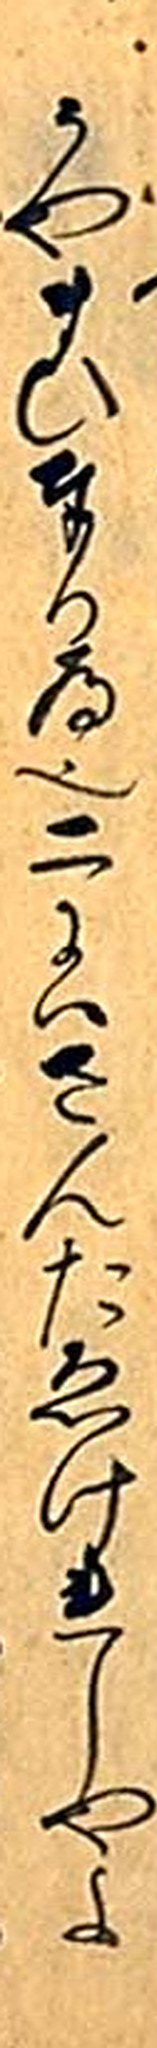うやまひ奉る為也二にはさんたゑけれしやよ
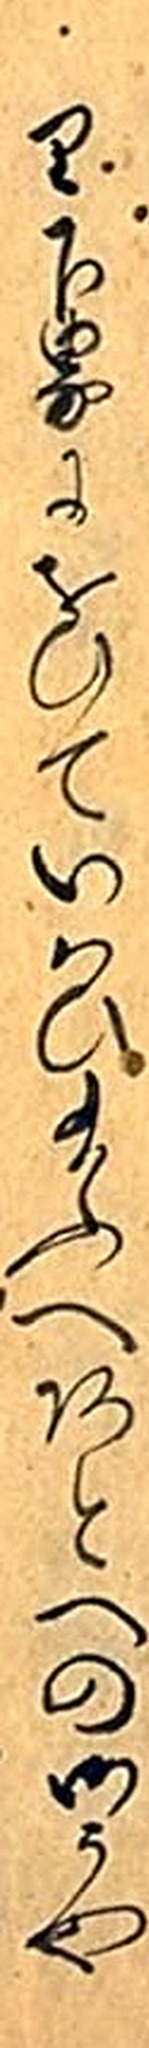り下界にをひていはひ給ふへあとへの御うや
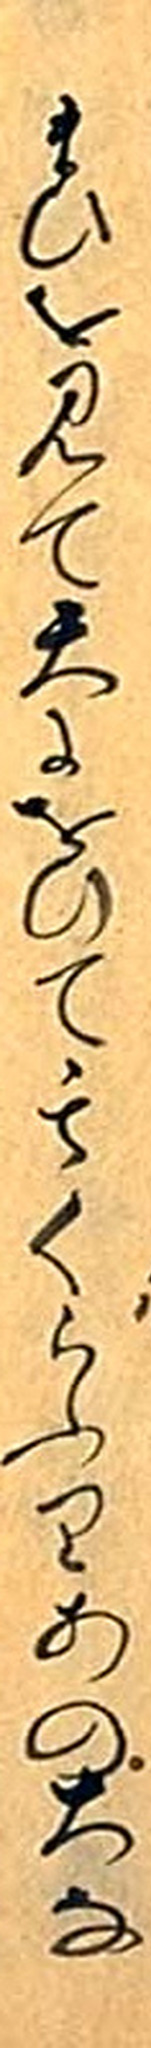まひを見て天にをひて其くらふりあの大な
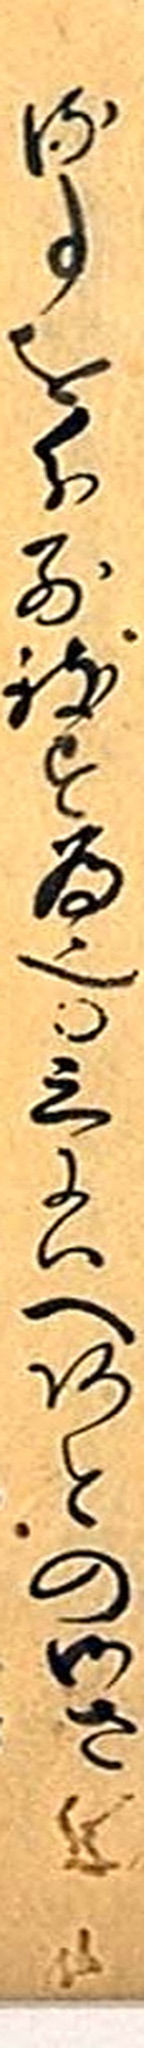る事を分別致す為也○三にはへあとの御さ
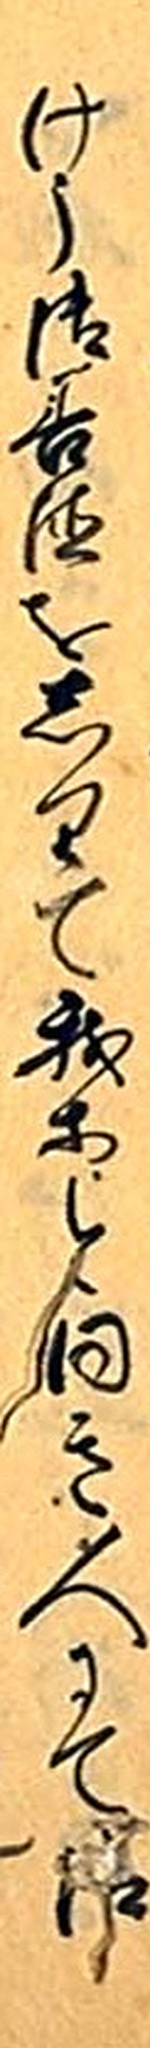けう御善徳をしりて我等と同き人にて御
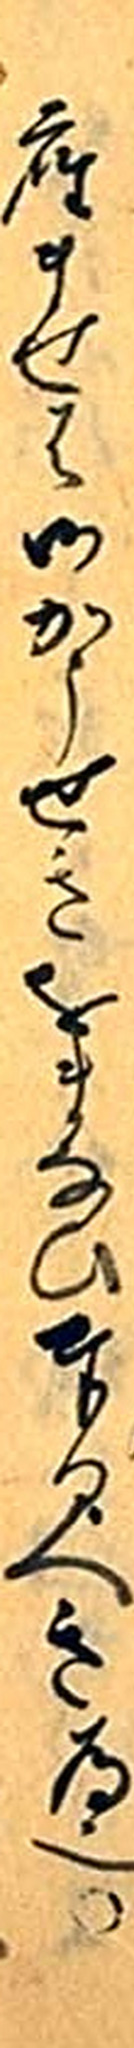座ませは御かうせきをまなひ奉るへき為也○
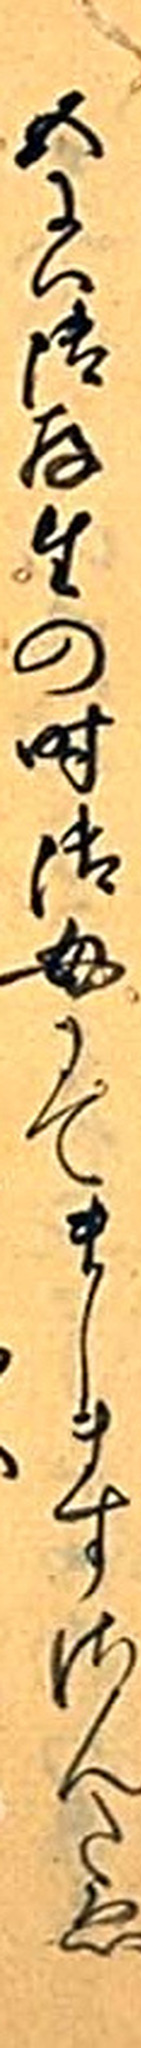五には御存生の時御母にてましますさんたゑ
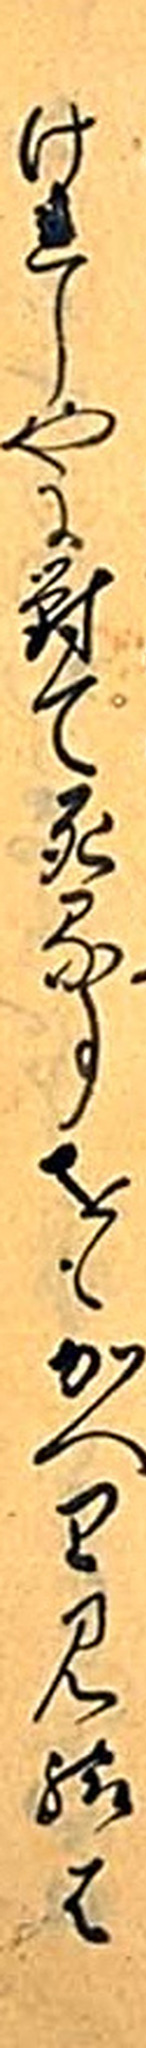けれしやに対て死る事をもかへり見給は
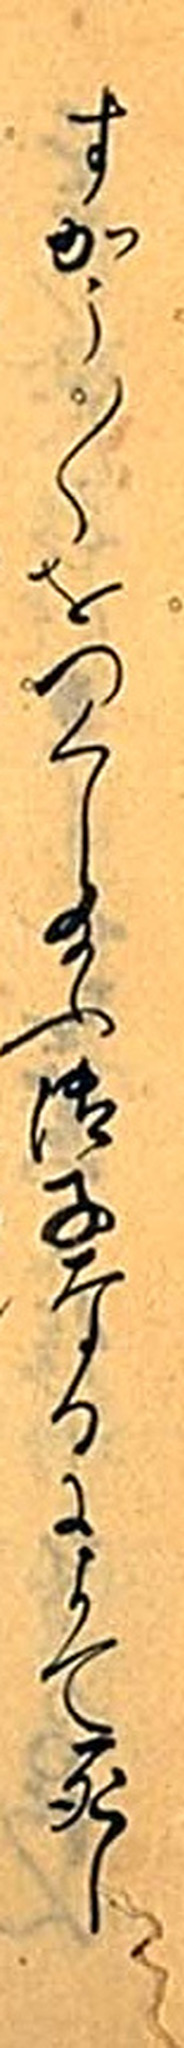すかう〳〵をつくし給ふ御子なるによて死し
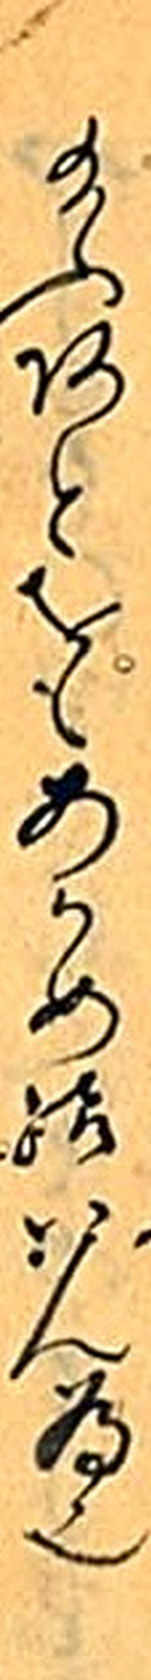給ふあとをもあかめ給はん為也
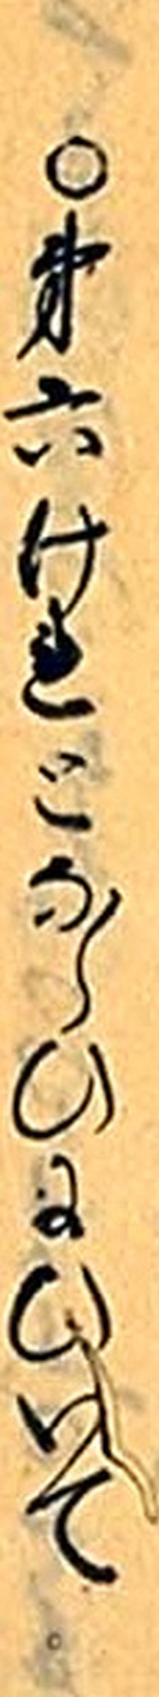○第六けれとならひにひいて
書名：ドチリナ・キリシタン
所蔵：東京大学総合図書館 / General Library in the University of Tokyo
